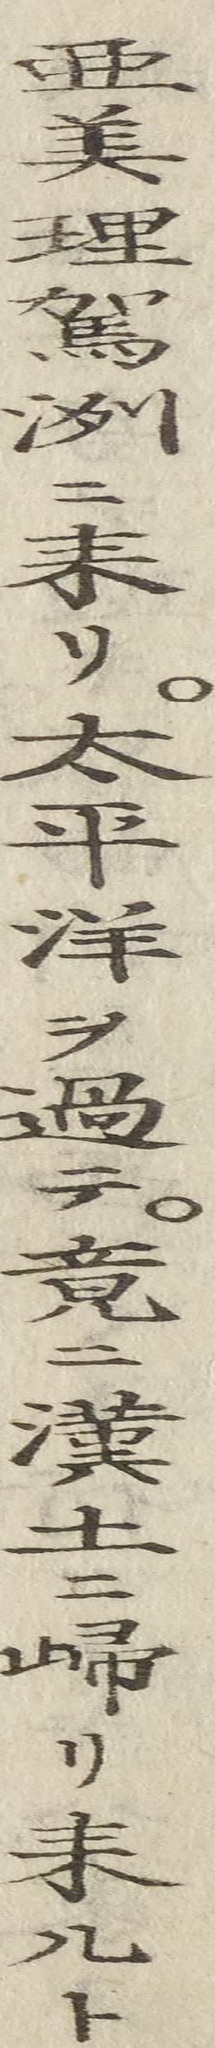亜美理駕洌ニ来リ。太平洋ヲ過テ。竟ニ漢土ニ帰リ来ルト
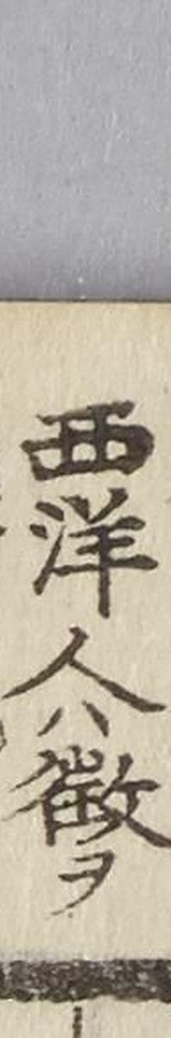西洋人ハ徴ヲ
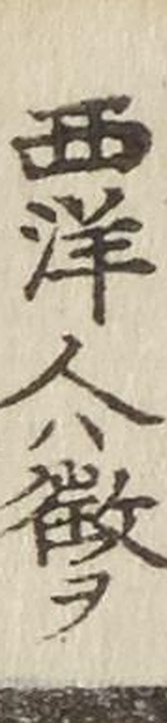西洋人ハ徴ヲ
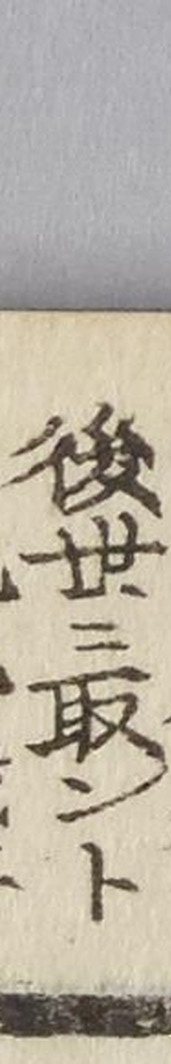後世ニ取ント
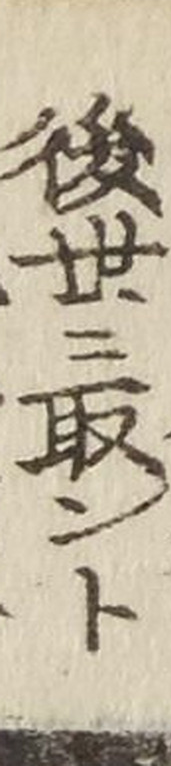後世ニ取ント
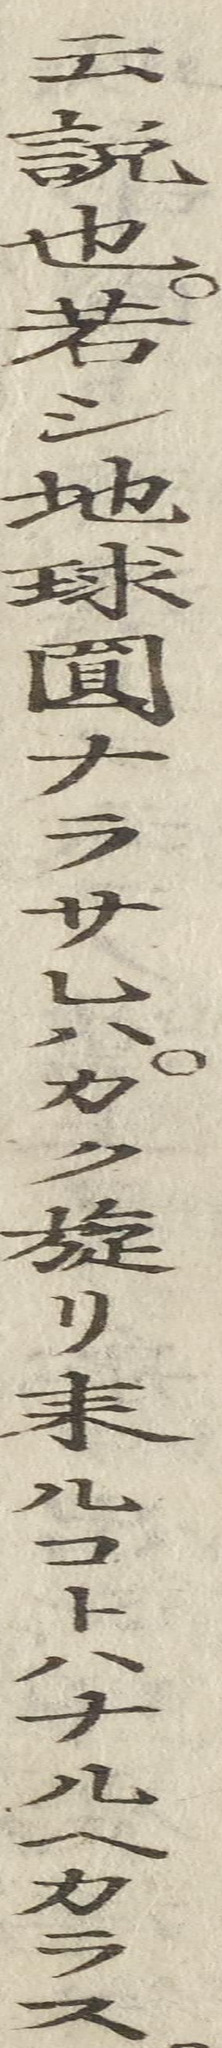云説也。若シ地球円ナラサレハ。カク旋リ来ルコトハナルヘカラス。
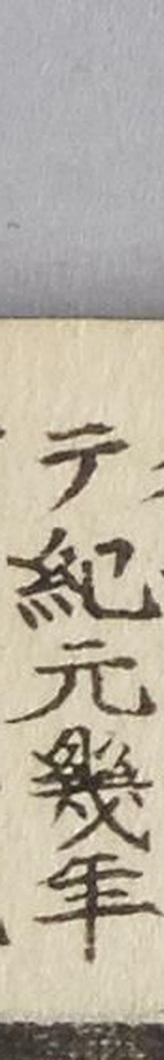テ紀元幾年
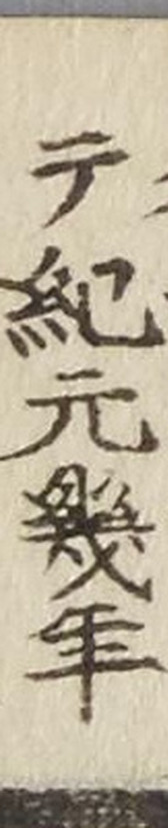テ紀元幾年
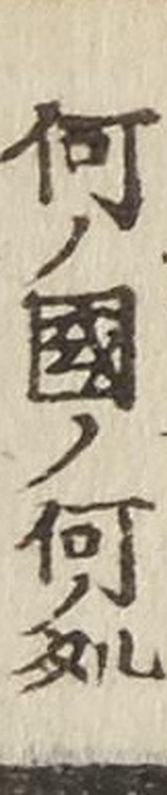何ノ国ノ何処
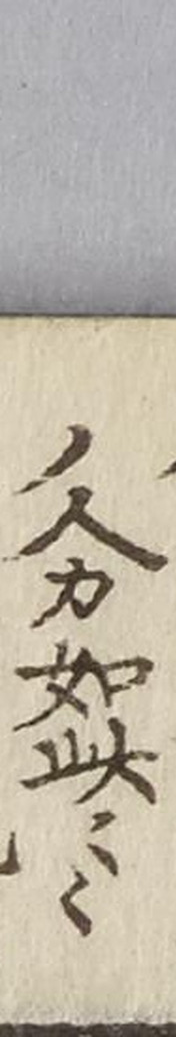ノ人カ如此々々
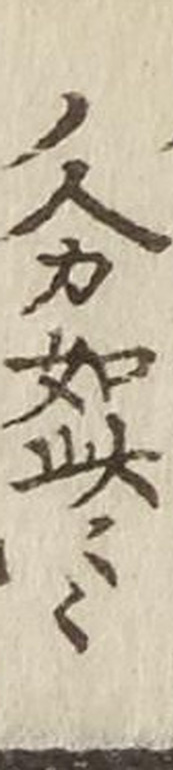ノ人カ如此々々
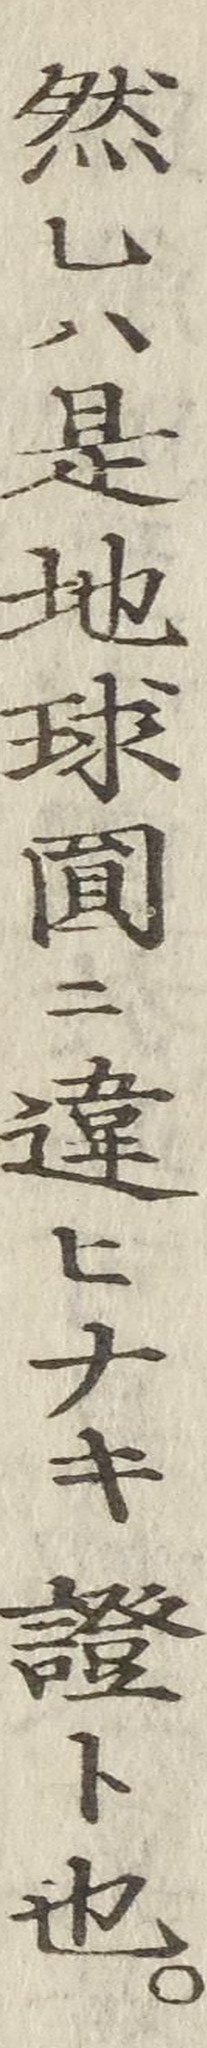然レハ是地球円ニ違ヒナキ証ト也。
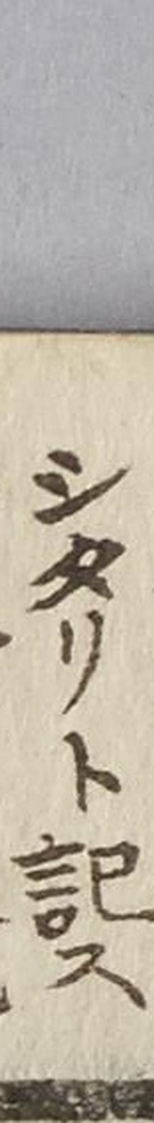シタリト記ス
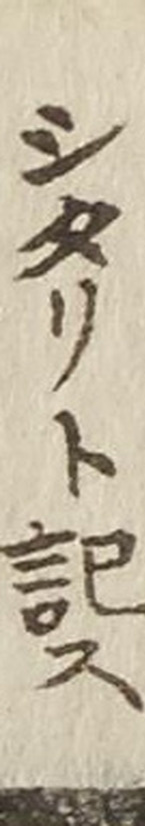シタリト記ス
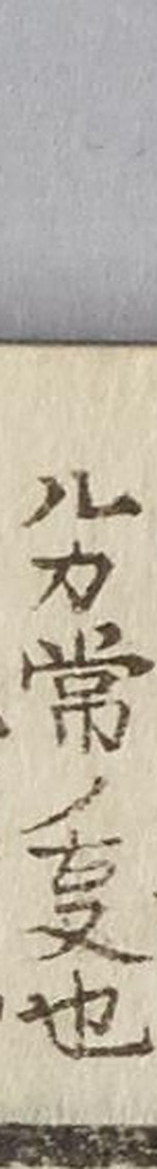ルカ常ノ事也
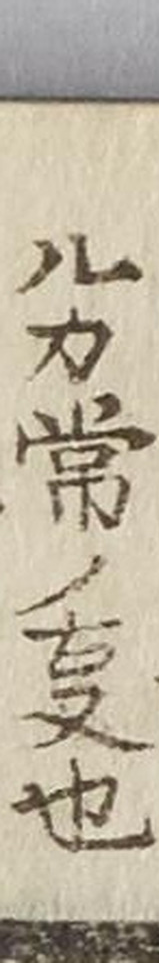ルカ常ノ事也
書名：護法新論　中
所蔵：東京大学地震研究所図書室 Earthquake Research Institute Library, The University of Tokyo, JAPAN
